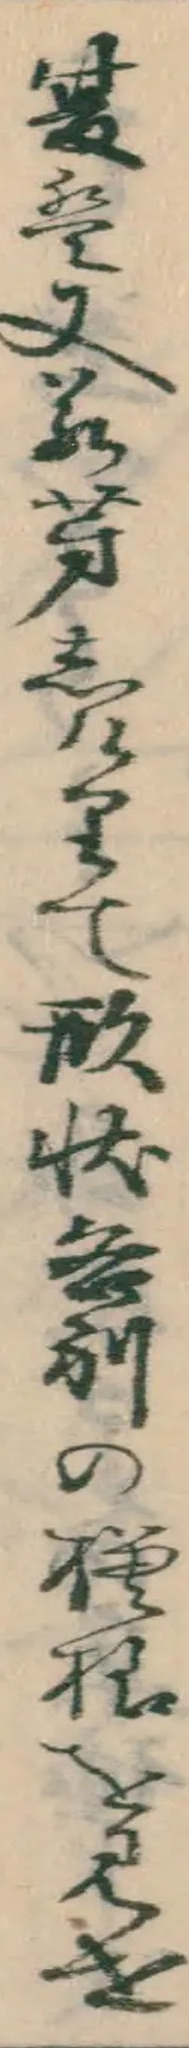夏は又若芽しけりて形状各別の模様を見せ
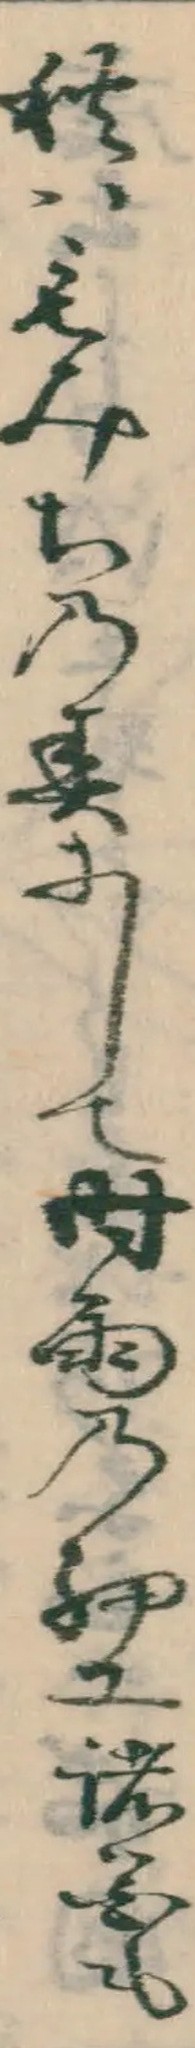秋はもみちの春にして時雨の細工諸花も
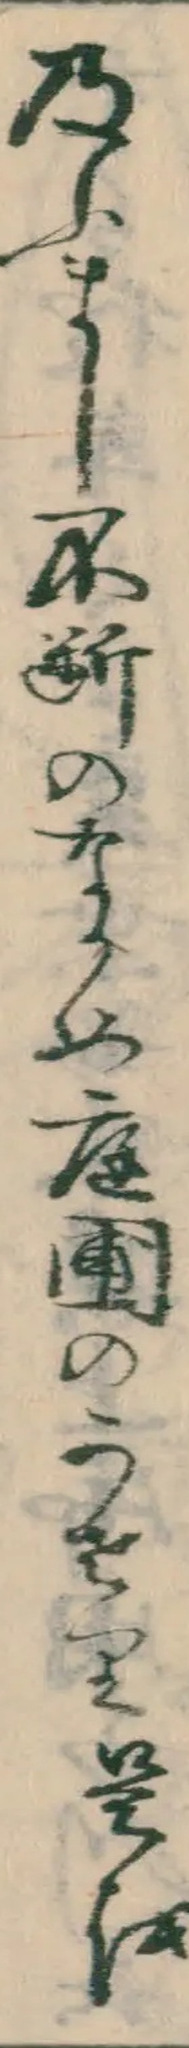及ふまし不断のなかめ庭圃のかさり是を
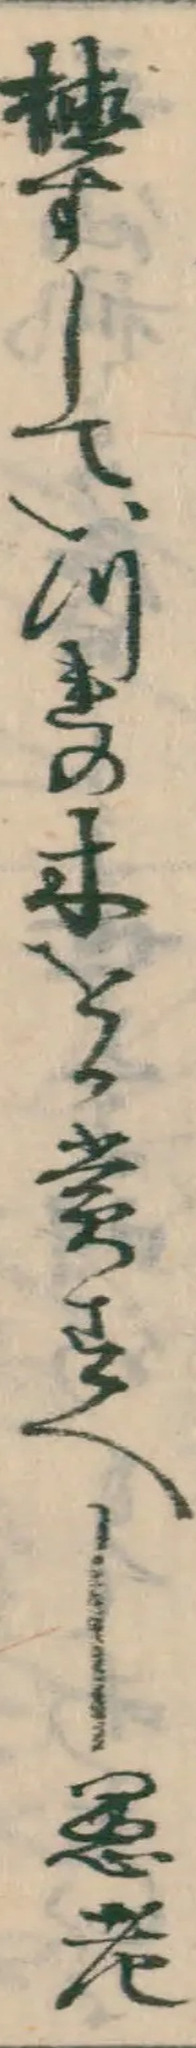植すしていつれの木をか賞すへし愚老
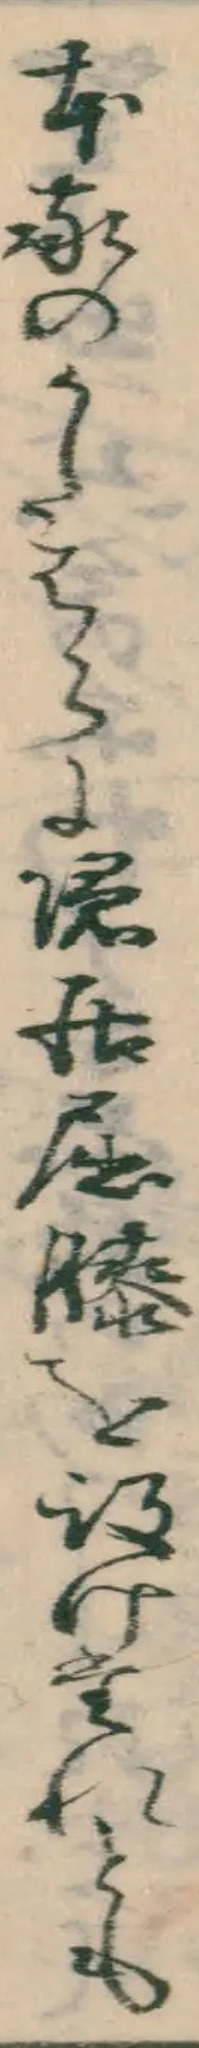本家のかたはらに隠居屈膝を設けたれとも
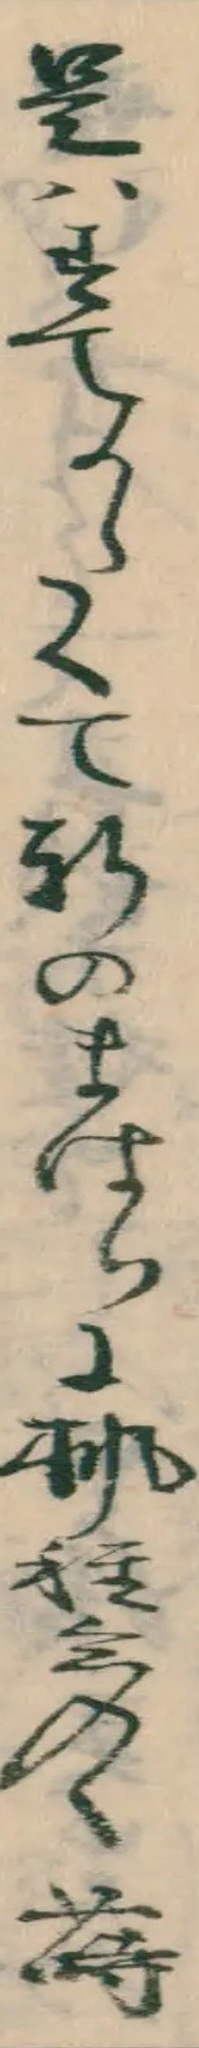是はすてかたくて軒のまはりに楓種多く蒔
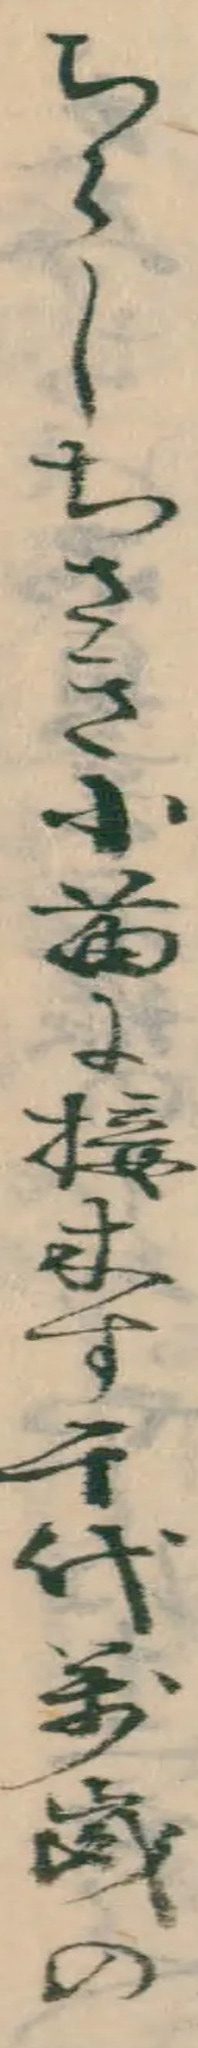ちらしちさき小苗に接木す千代萬歳の
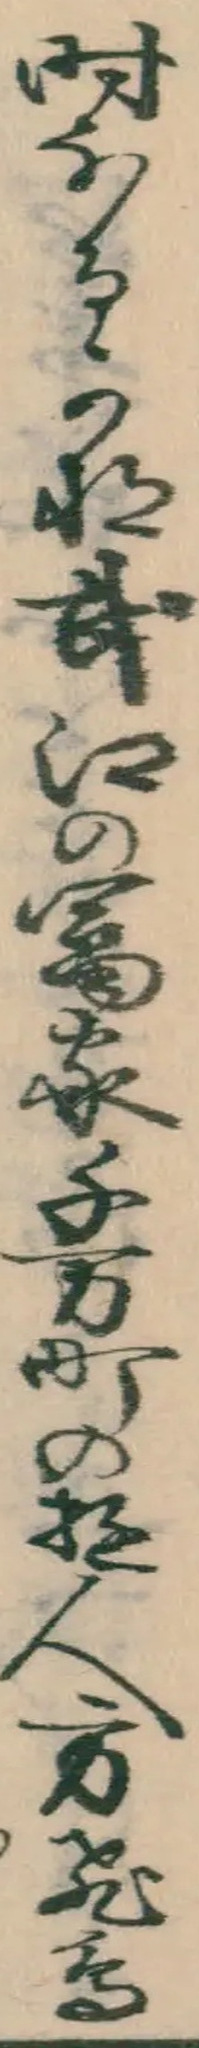時なるかな武郷の富家千万町の遊人方飛鳥
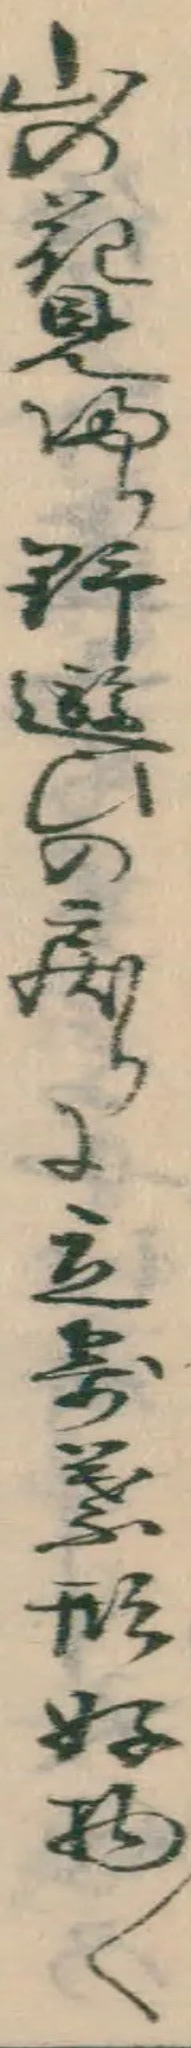山の花見帰り野遊ひの戻りに立寄葉形好物〳〵
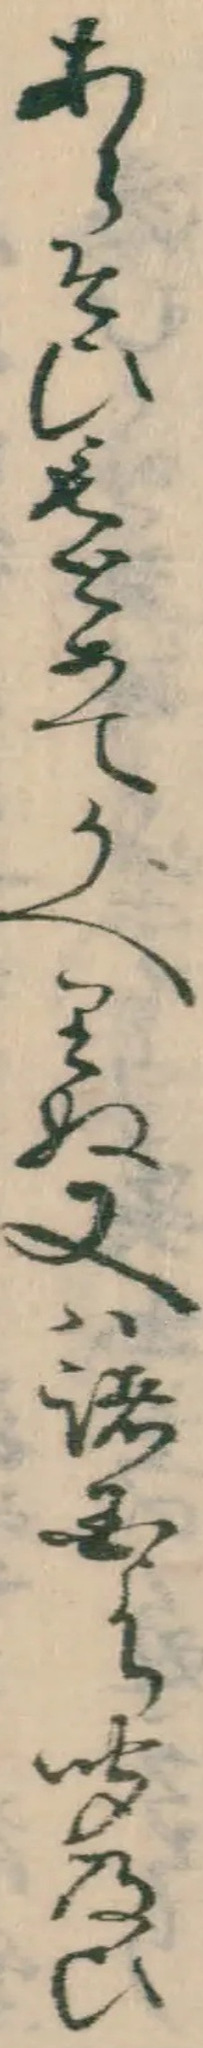あらそひもとめてかへりぬ又は諸国より聞及ひ
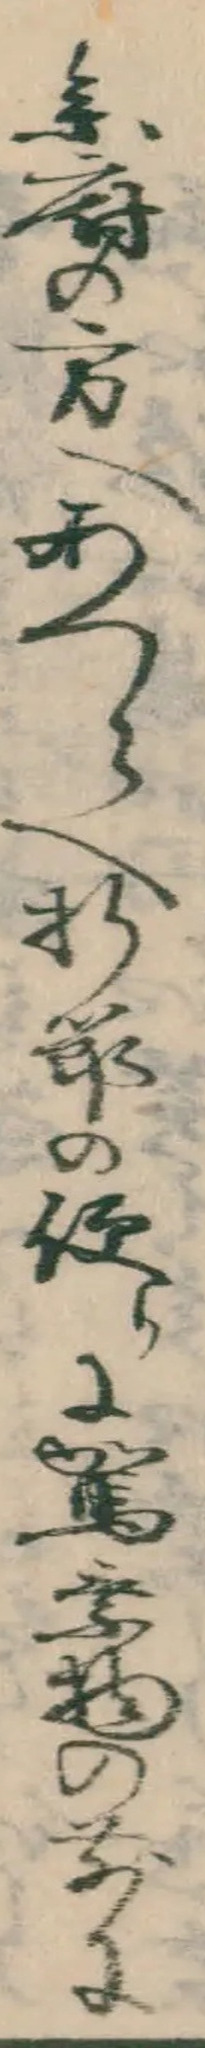参府の方へあつらへ折節の便りに駕乗物の前に
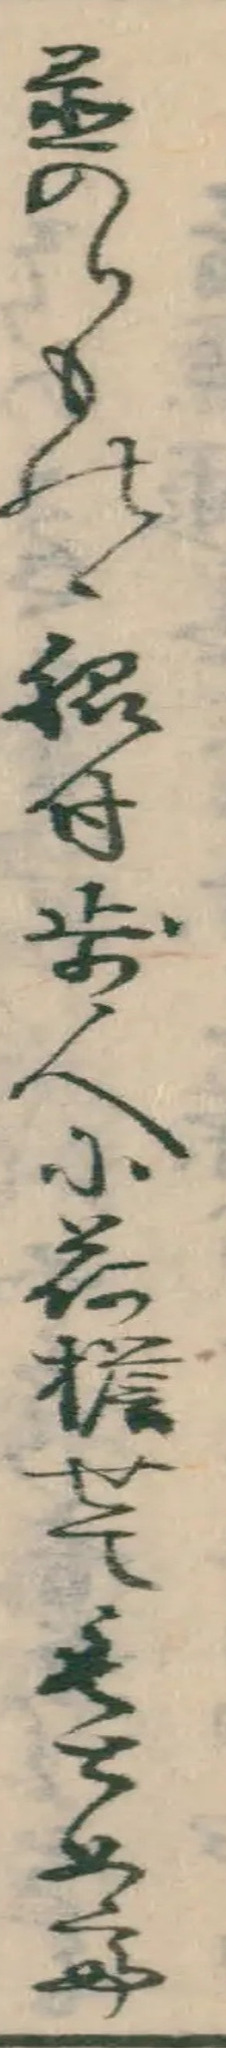置のりものゝ脇付歩人に荷担せてもとめて
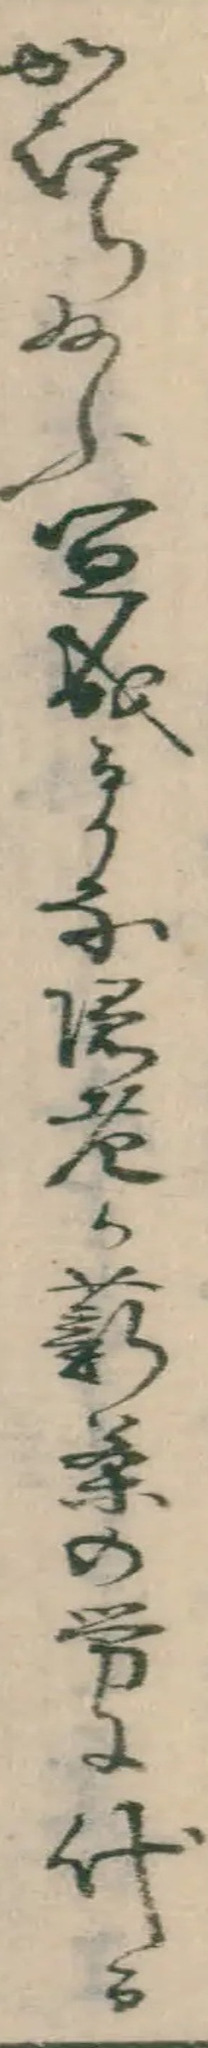かえり給ふ宜成るかな隠老の薪茶の労に代る
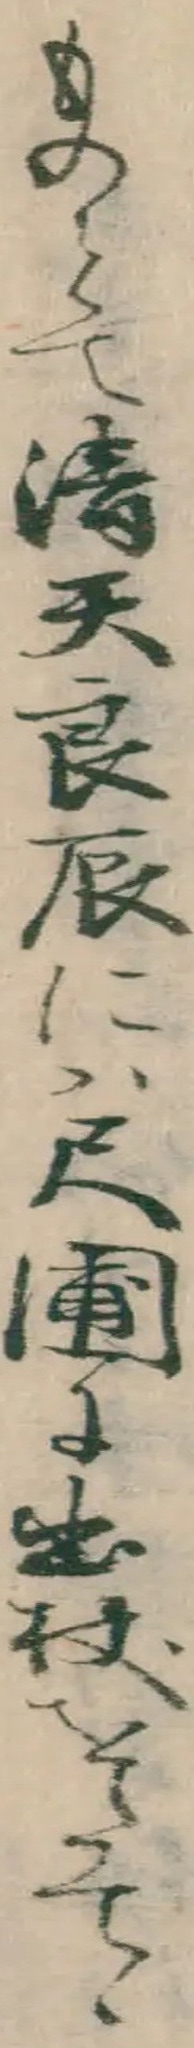ものとて清天良辰には尺甫に出杖をたてゝ
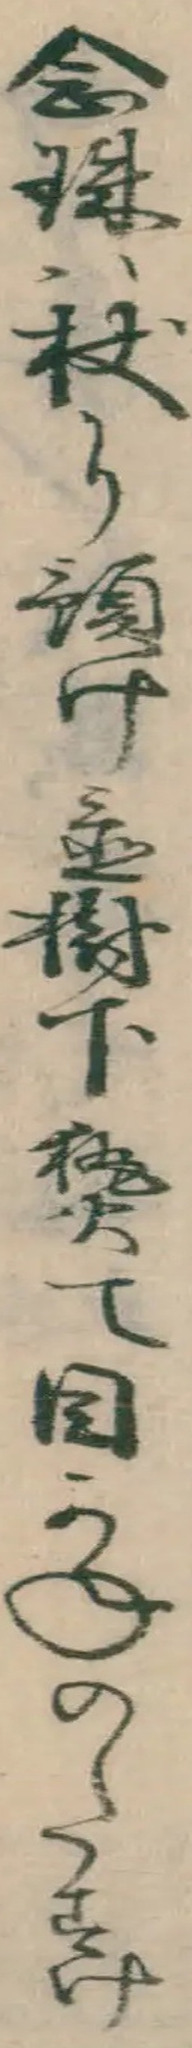念珠は杖に預け置樹下熱て目かねのたすけ
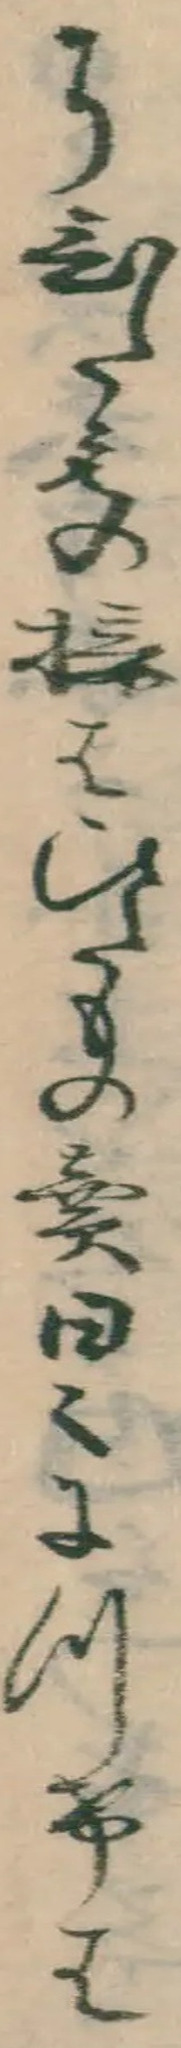にひたもの接はひたもの売日々につけは
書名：紅葉集
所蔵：国立国会図書館 National Diet Library, JAPAN
